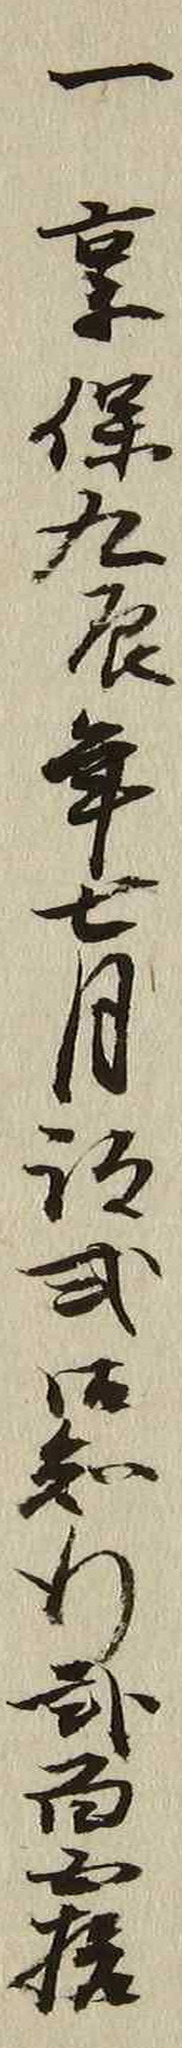一享保九辰年七月跡式御知行弐百五拾
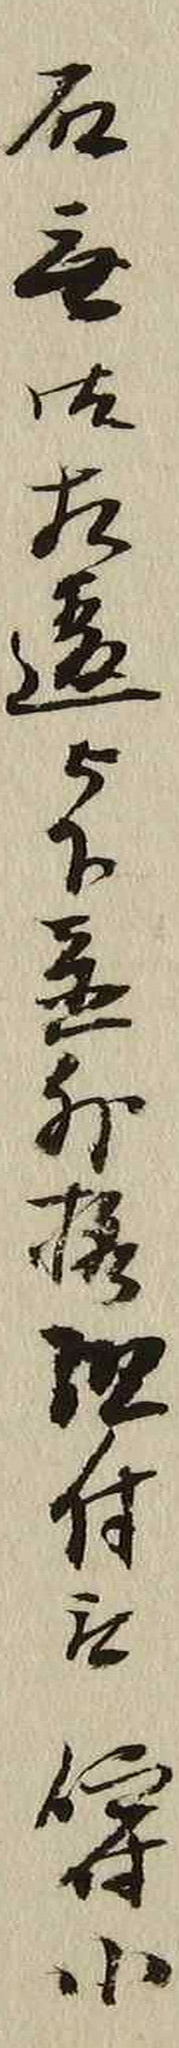石無御相違被下置外様組付被仰付小
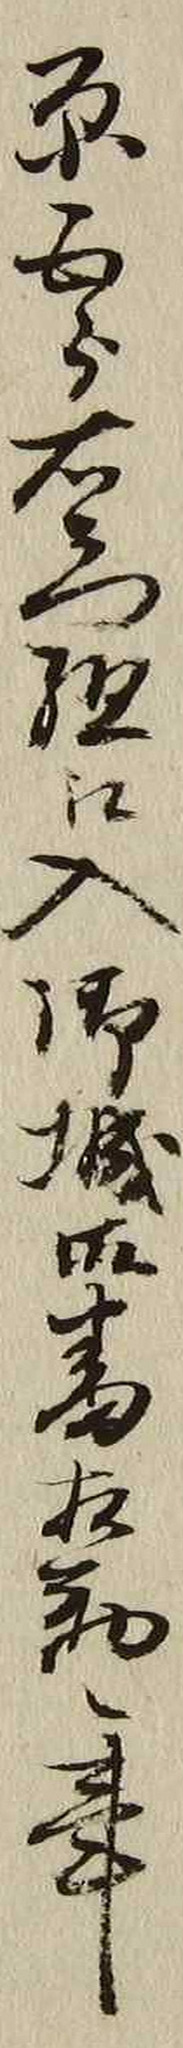原五郎右衛門組江入御城御番相勤候事
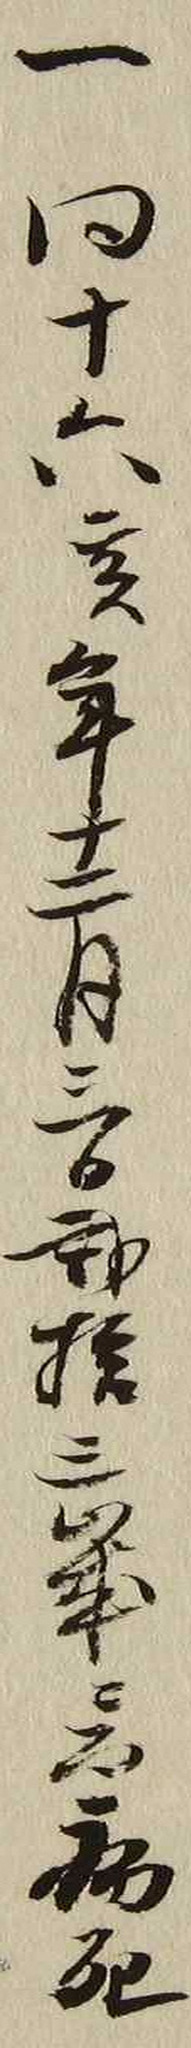一同十六亥年十二月三日弐拾三歳ニ而病死
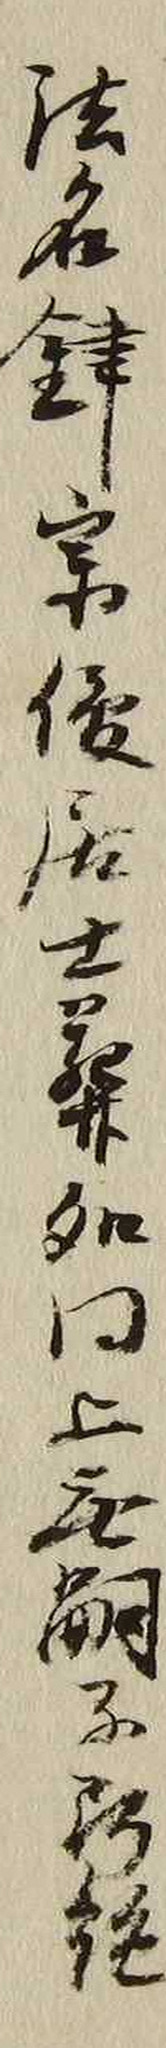法名銉宗俊居士葬処同上無嗣子断絶
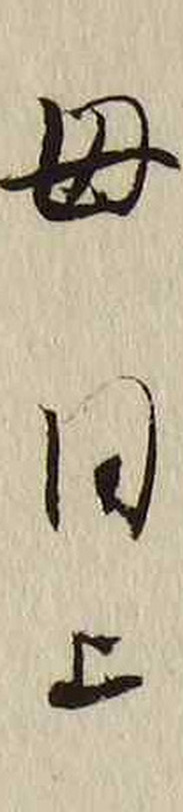母同上
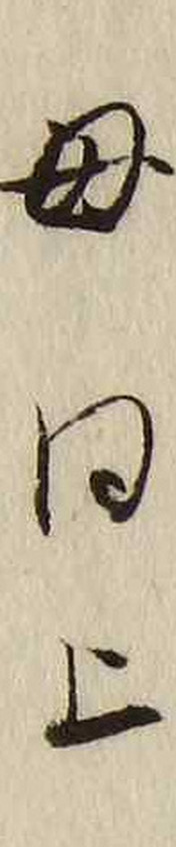母同上

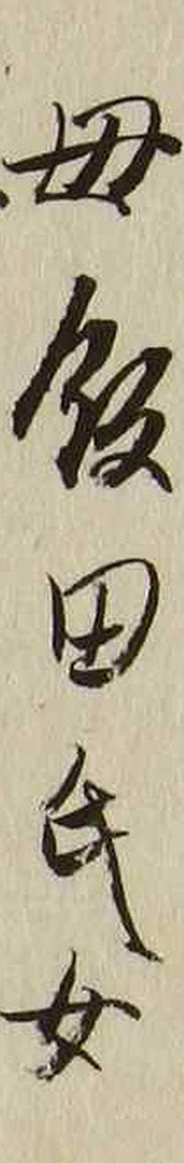母飯田氏女
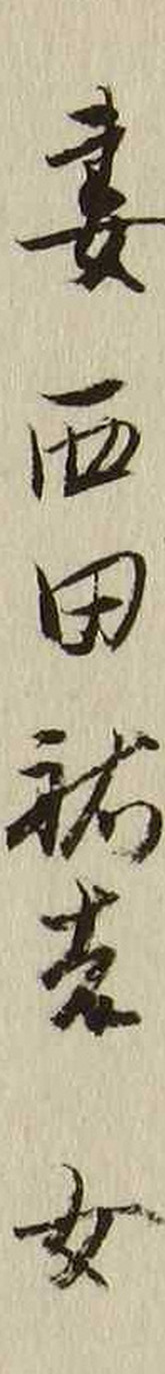妻西田祐吉女
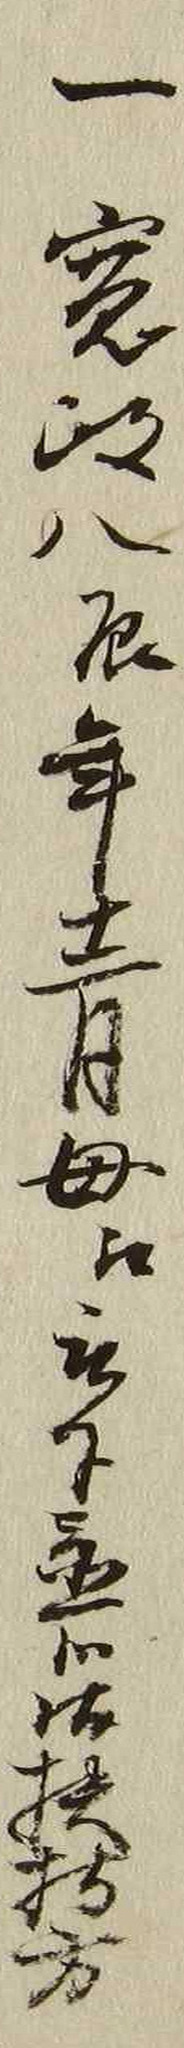一寛政八辰年十二月母江被下置候御扶持方
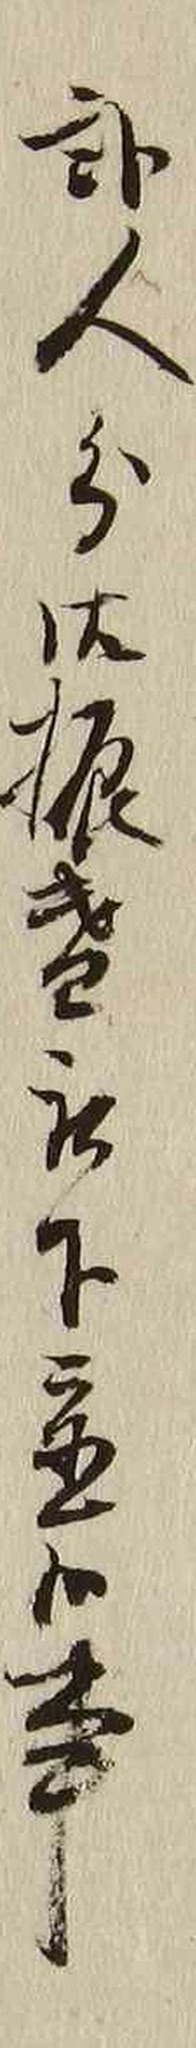弐人分御振替被下置候事
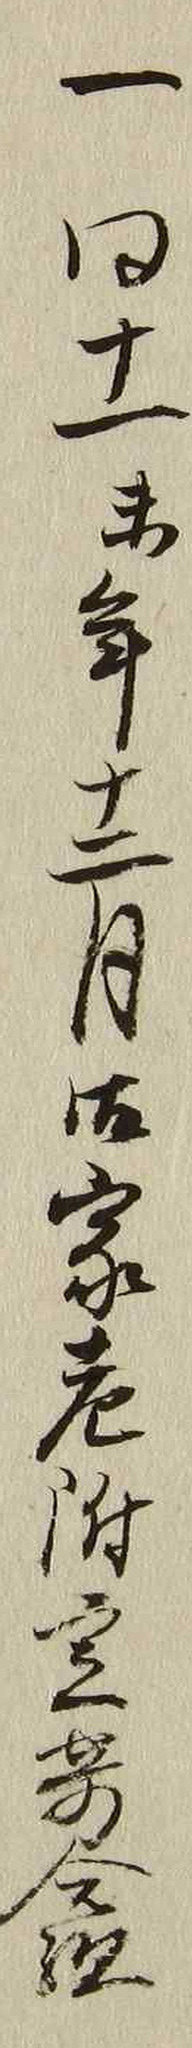一同十一未年十二月御家老附定寄合組
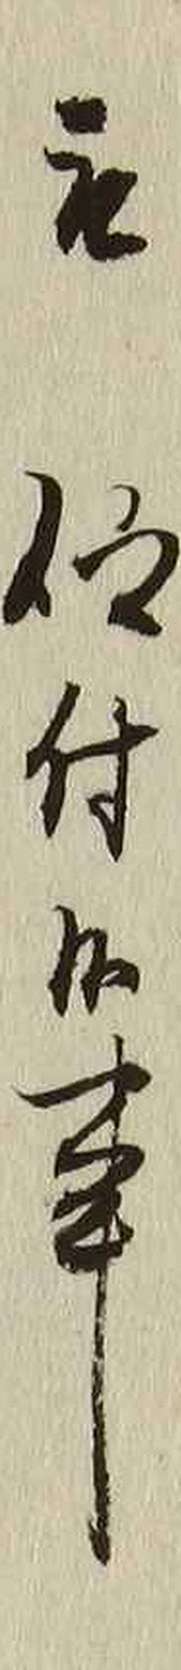被仰付候事
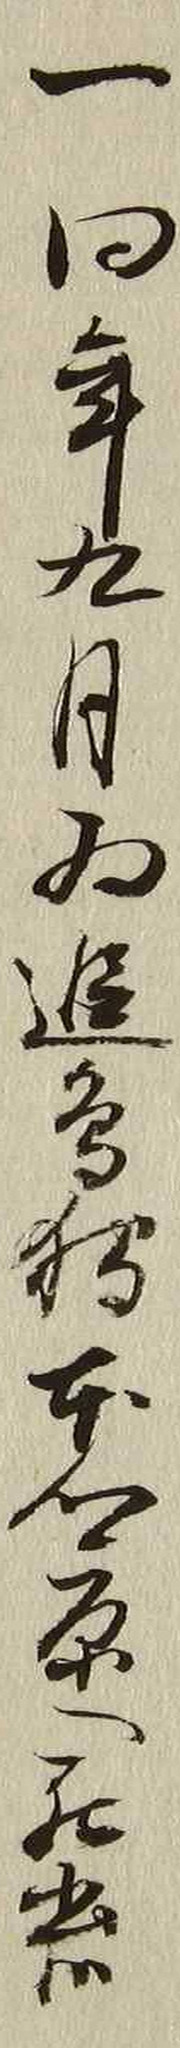一同年九月為追鳥狩本郷原へ罷出候
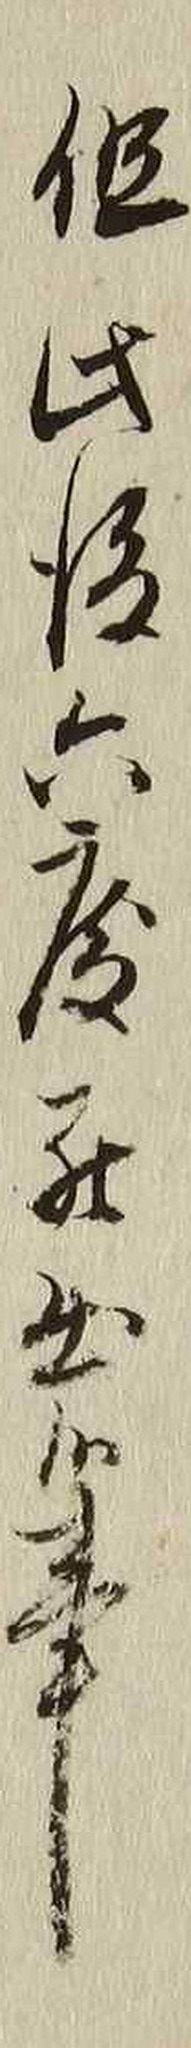但此後六度罷出候事
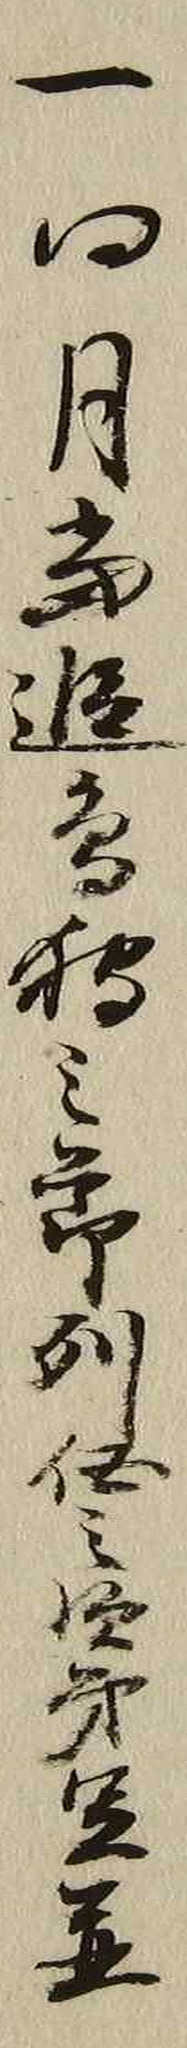一同月当追鳥狩之節列伍之次第足並
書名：諸士系譜　巻之349　も之部5
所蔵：会津若松市立会津図書館
